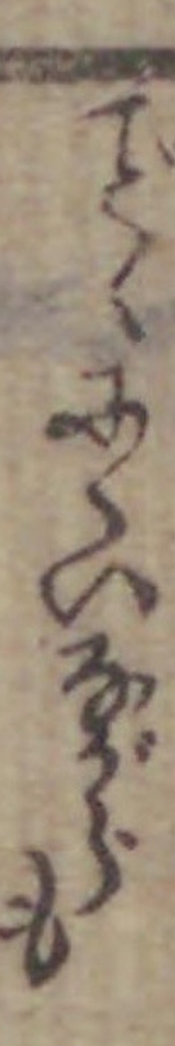ごとくにくいながらも
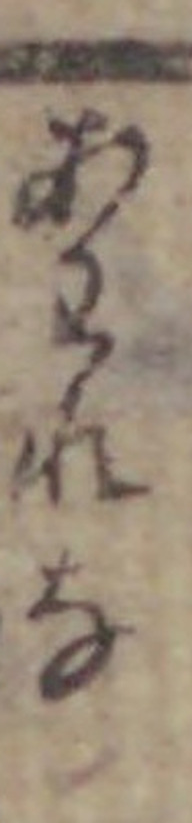あわれな
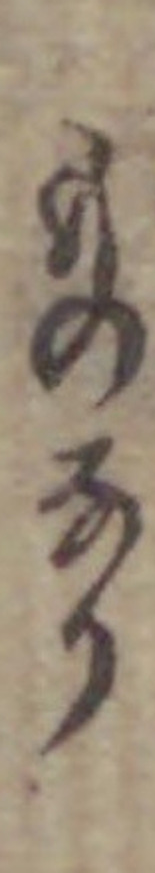ものなり
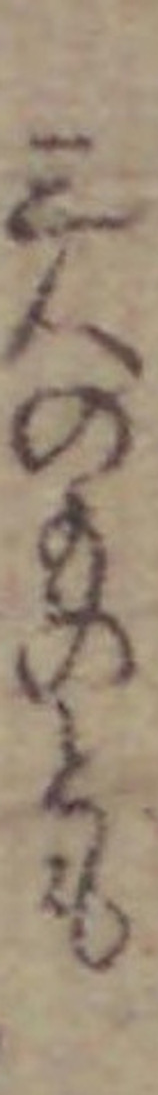三人のものとも
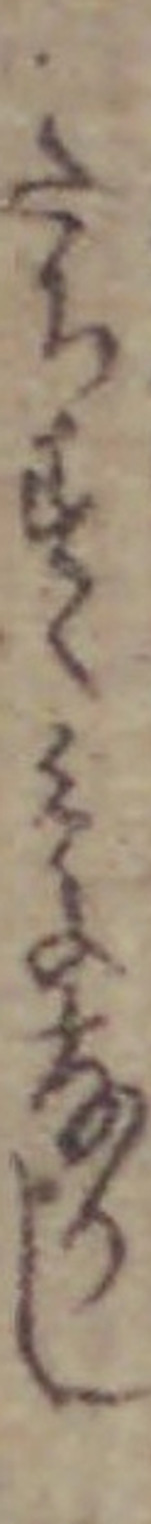たちすくみになりし
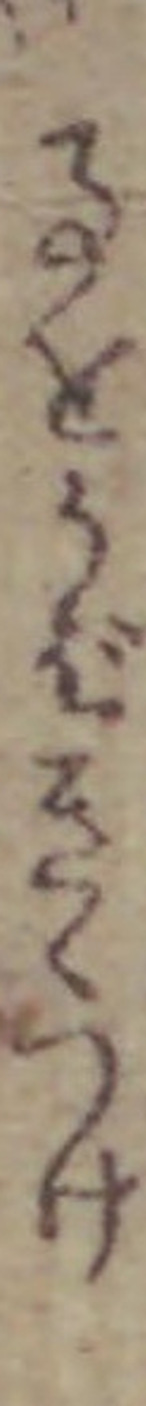事をうばきゝつけ
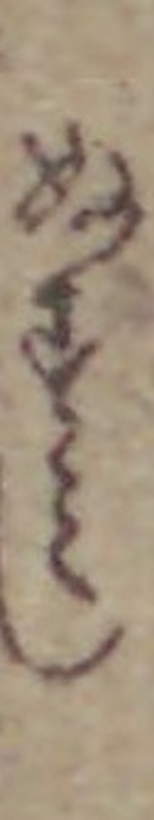ぬすみし
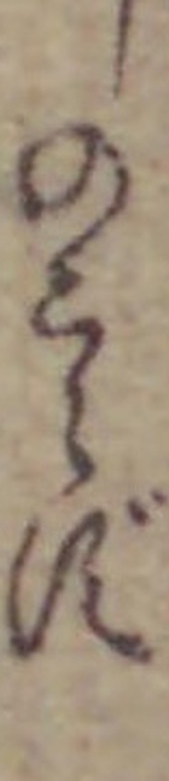のこらず
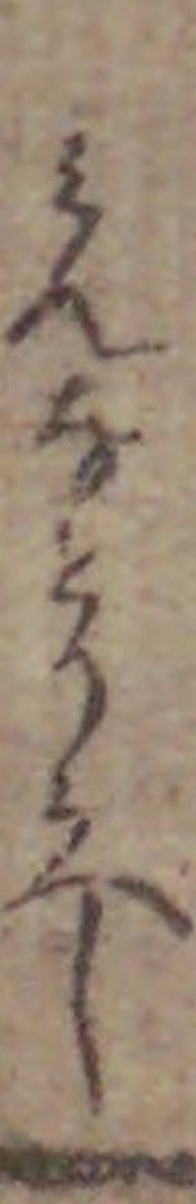みんなとりかへし
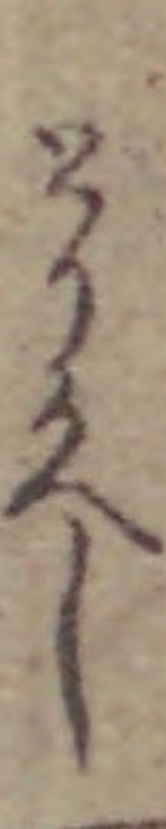とりかへし
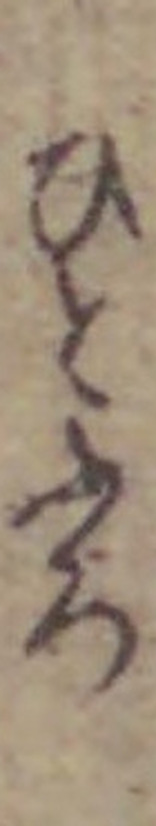ひとふろ
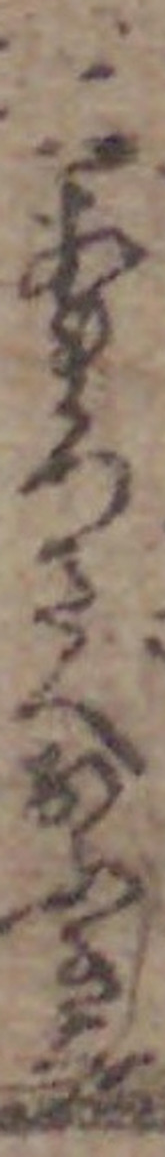あまつさへおふきな
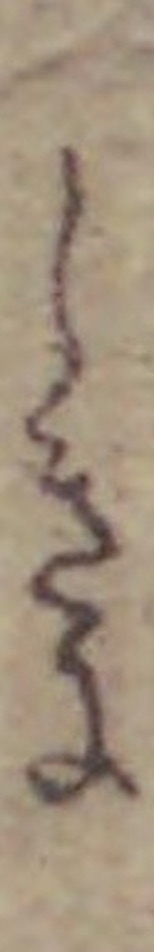しきに
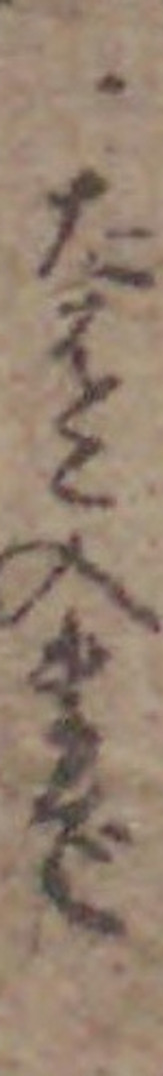たはこ入まで
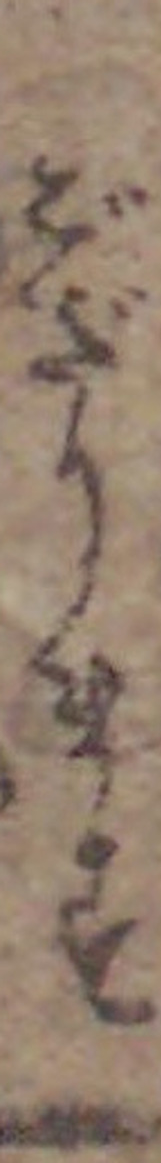ござります
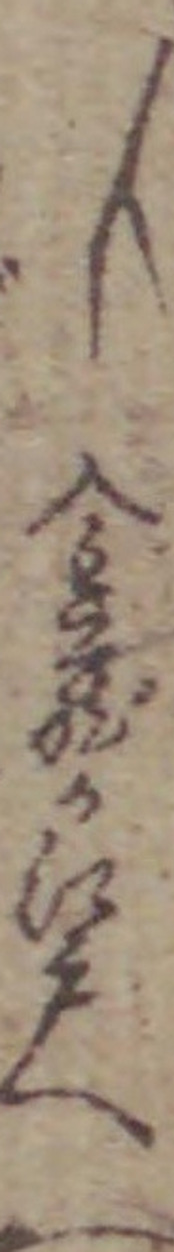金蔵か江戸へ
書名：御代の御寶
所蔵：国立国会図書館 National Diet Library, JAPAN
